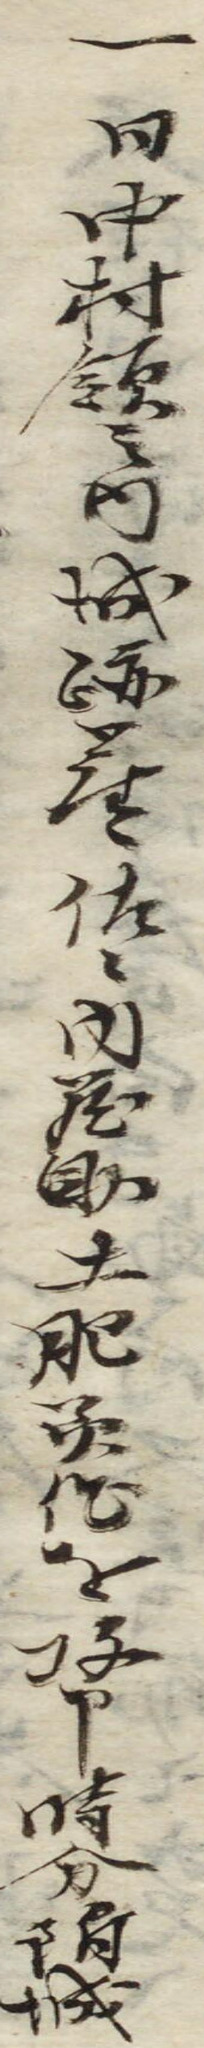一日中村領之内城跡御座候佐々内蔵助土肥美作を攻申時分附城
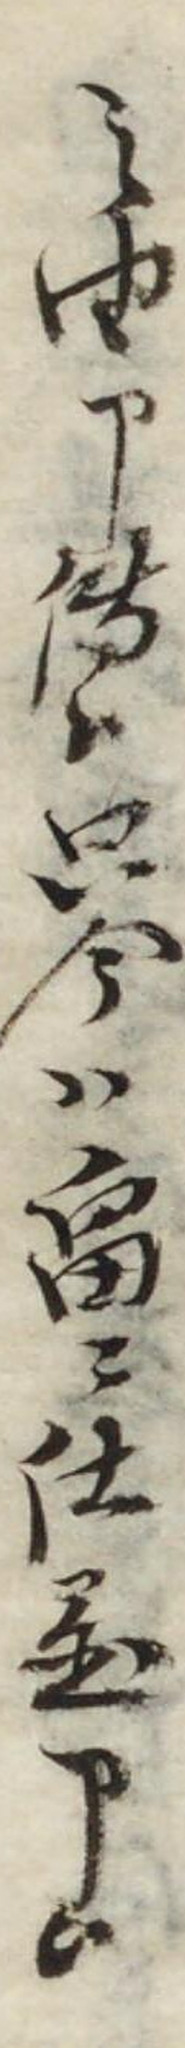之由申伝候只今は畠に仕置申候
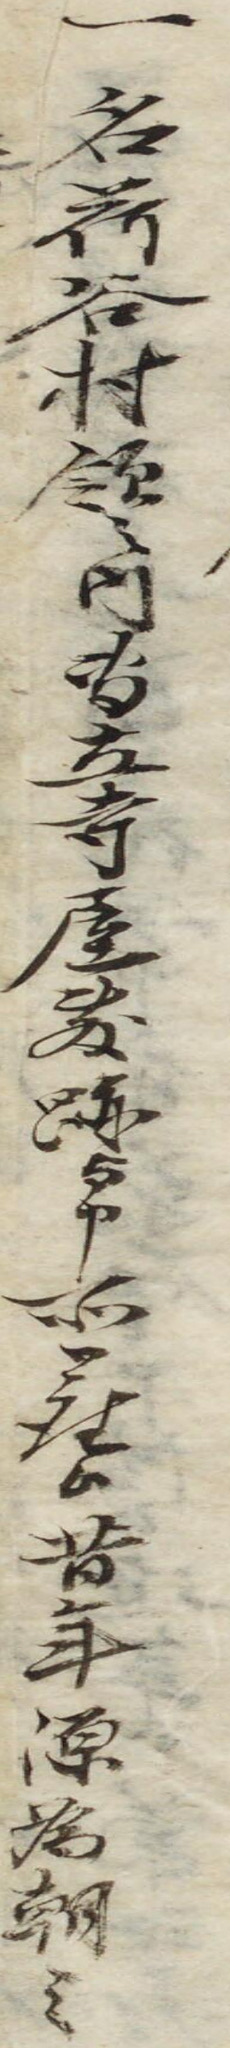一名荷谷村領之内専立寺屋敷跡与申所御座候昔年源為朝之
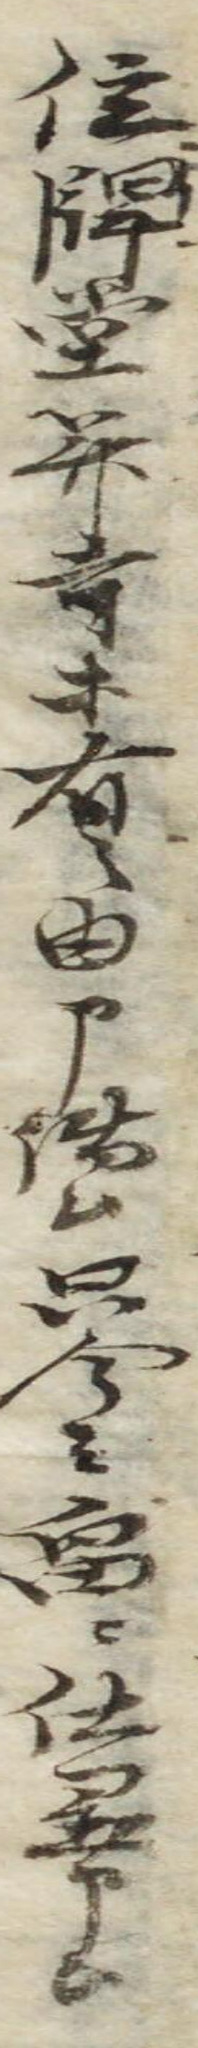位牌堂并寺等有之由申伝候只今は畠に仕置申候
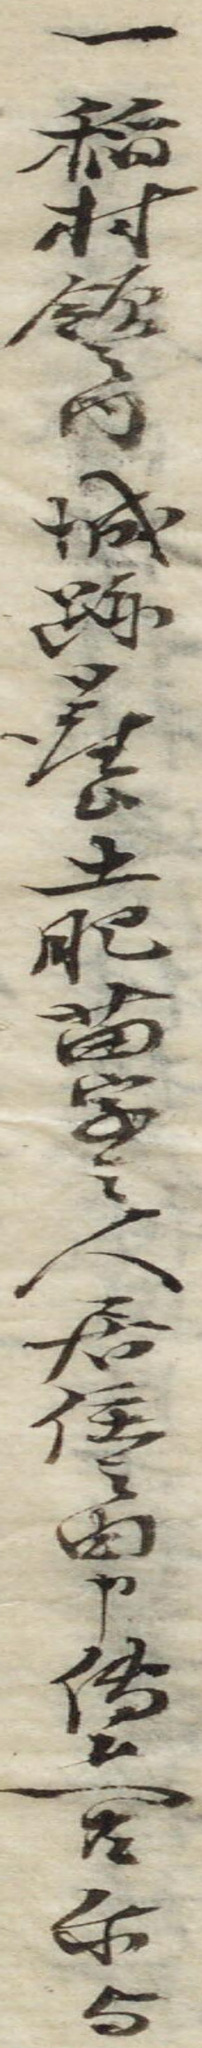一稲村領之内城跡御座候土肥苗字之人居住之由申伝候へ共尓与
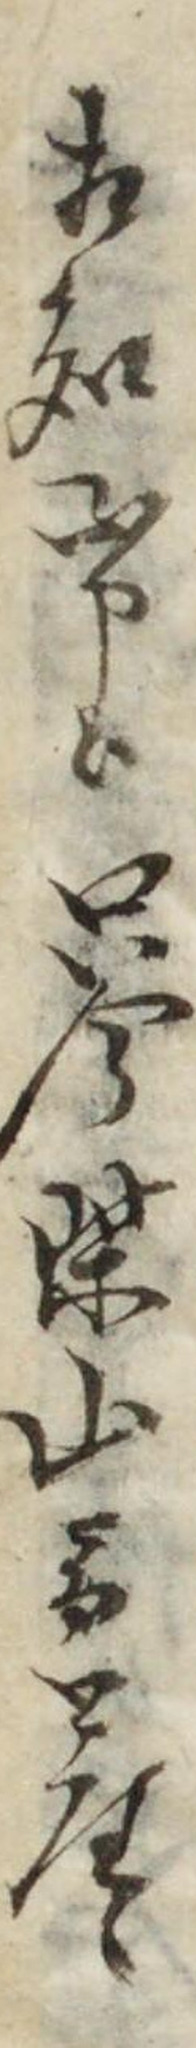相知不申候只今柴山に而御座候
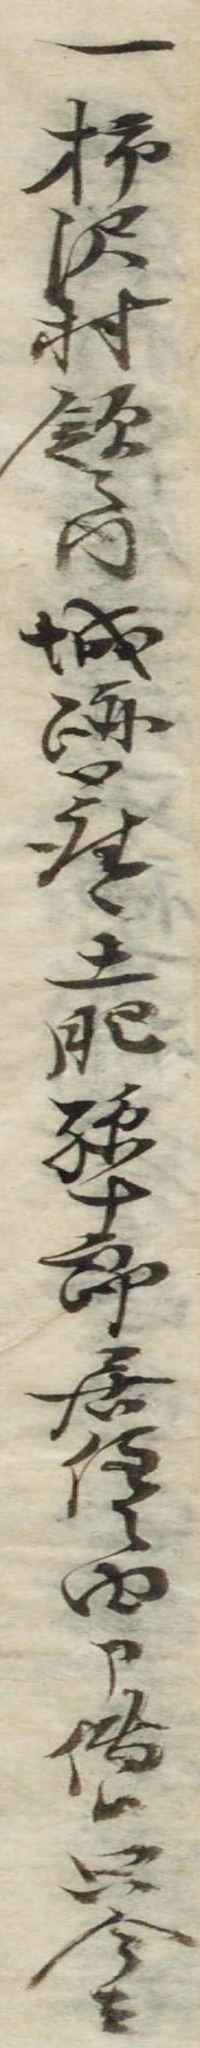一柿沢村領之内城跡御座候土肥孫十郎居住之由申伝候只今は
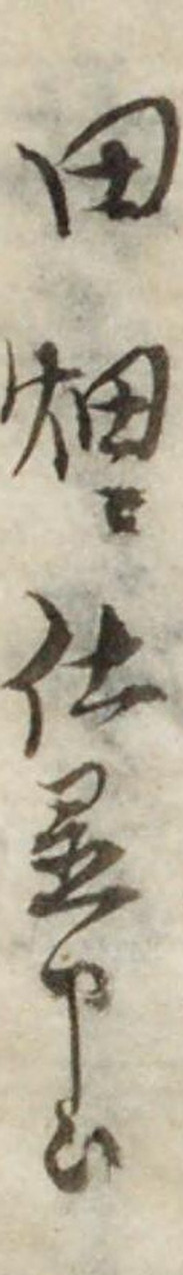田畑に仕置申候
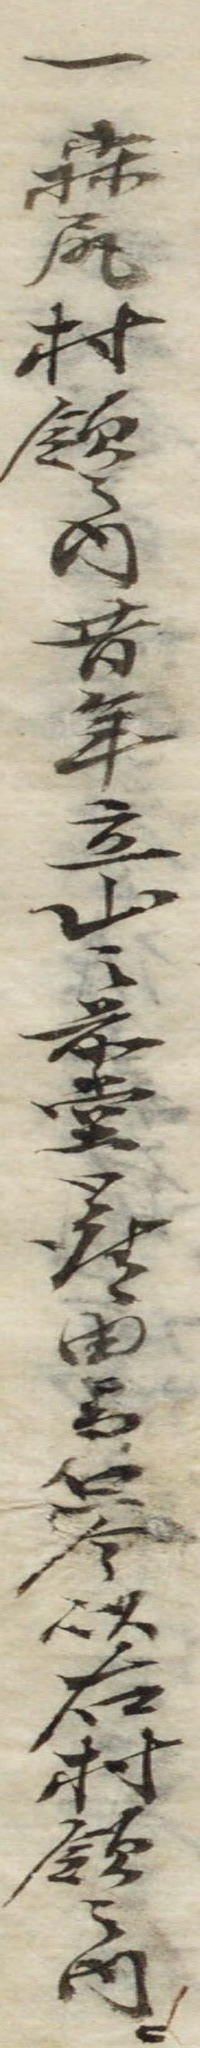一森尻村領之内昔年立山之前堂御座候由に而只今以右村領之内に
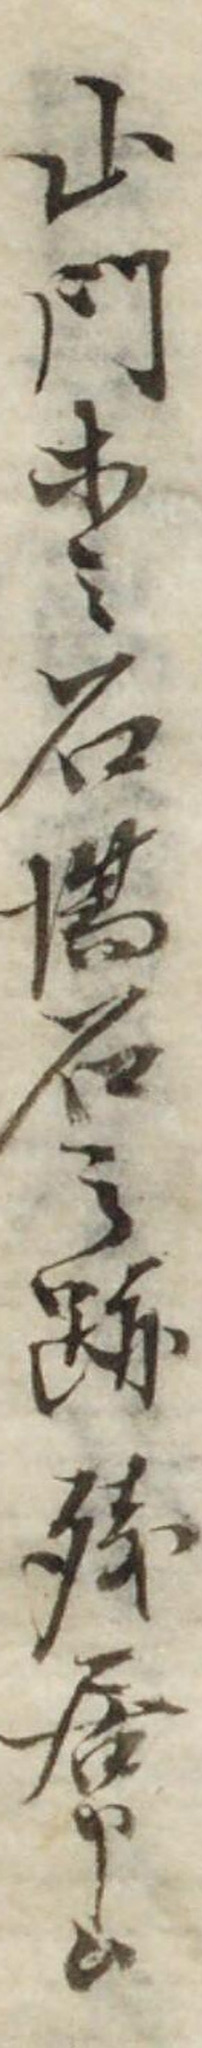山門等之石場石之跡残居申候
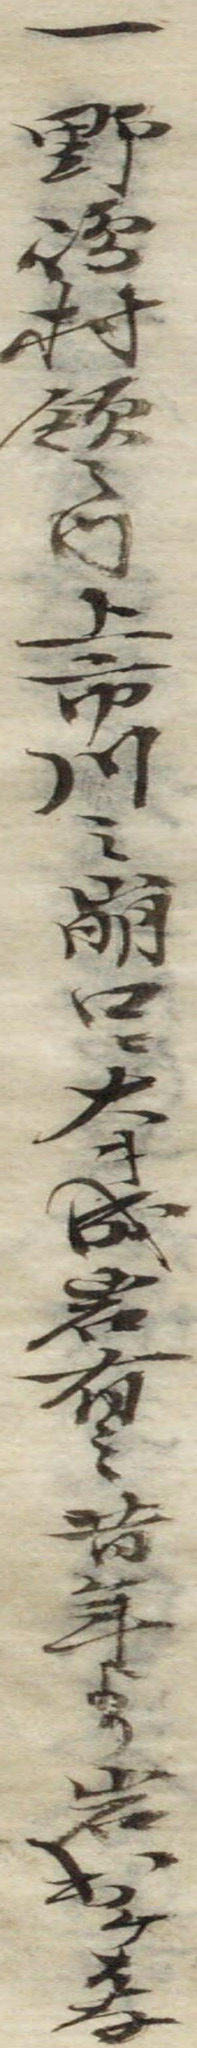一野嶋村領之内上市川之崩口に大き成岩有之昔年より岩出ヶはな
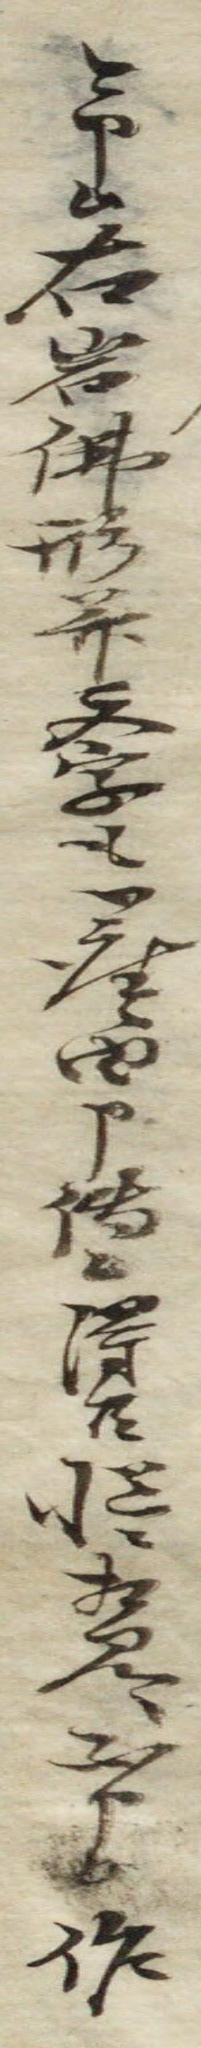と申候右岩仏形并文字も御座候由申伝候得共慥に相見へ不申候作

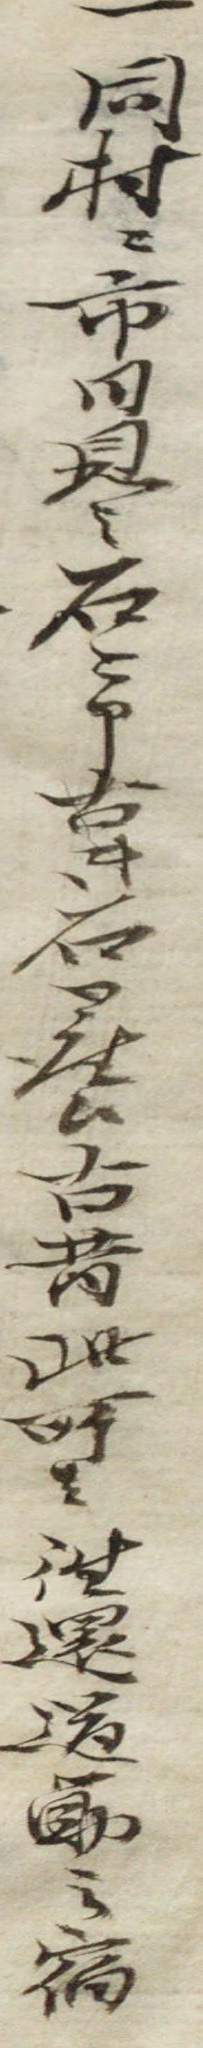一同村に市日見之石と申古き石御座候古昔此所は往還道筋之宿
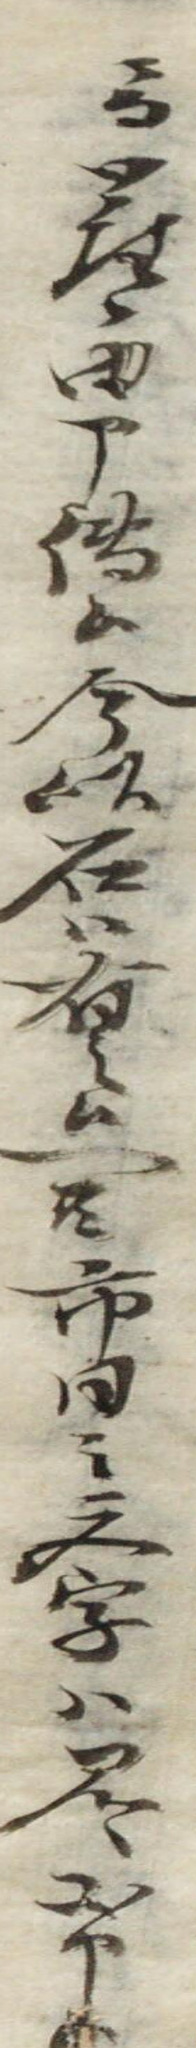に而御座候由申伝候今以石は有之候へ共市日之文字は見へ不申候
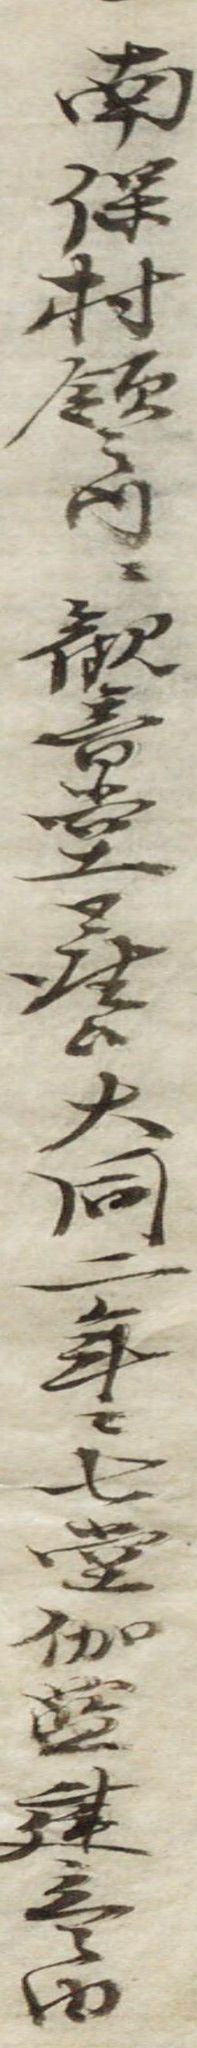一南保村領之内に観音堂御座候大同二年に七堂伽藍建立之由
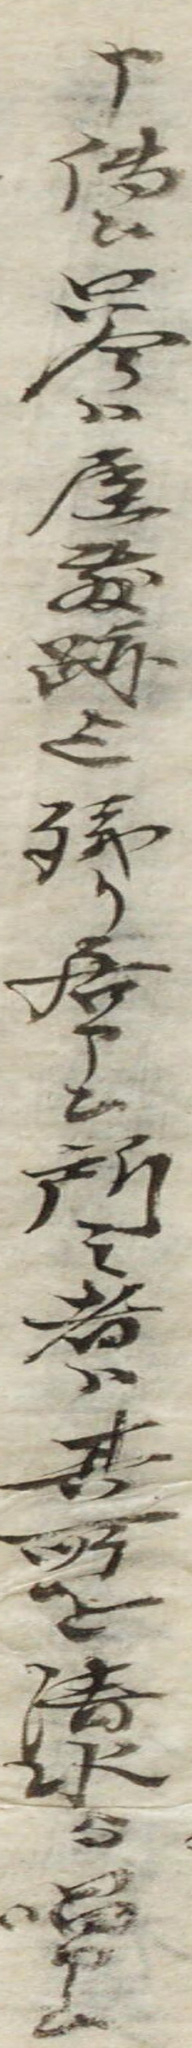申伝候只今は屋敷跡迄残り居申候所之者は其所を清水与唱申候
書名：加越能旧聞録
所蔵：Ishikawa Prefectural Library
